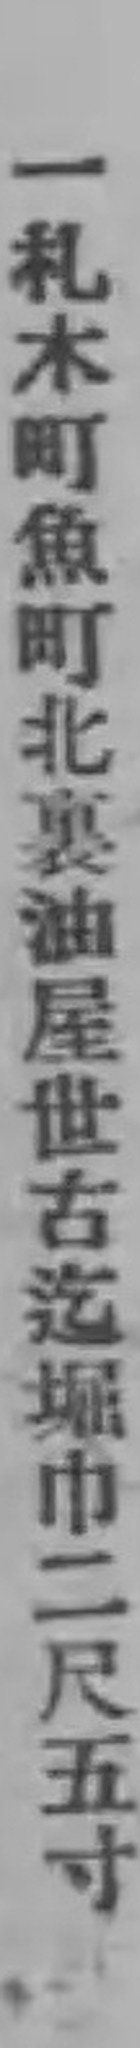一札木町魚町北裏油屋世古迄堀巾二尺五寸

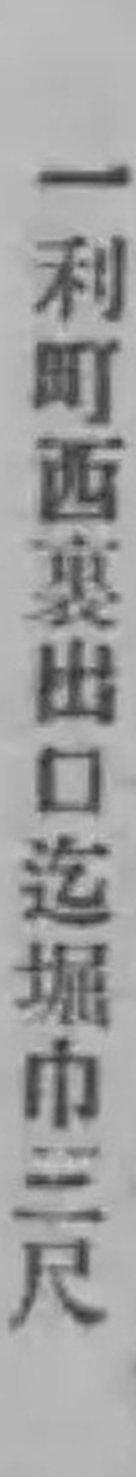一利町西裏出口迄堀巾三尺
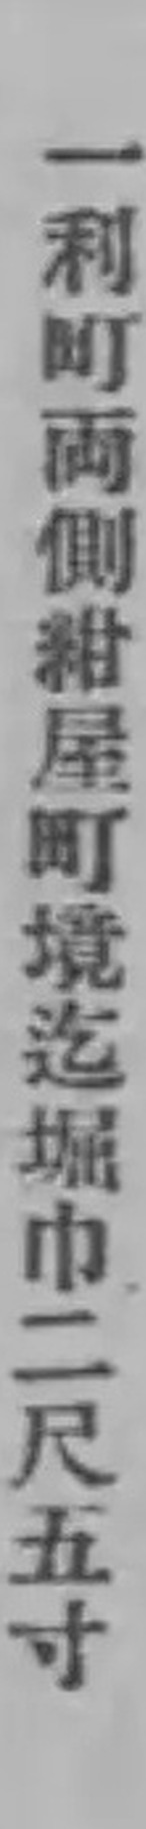一利町両側紺屋町境迄堀巾二尺五寸
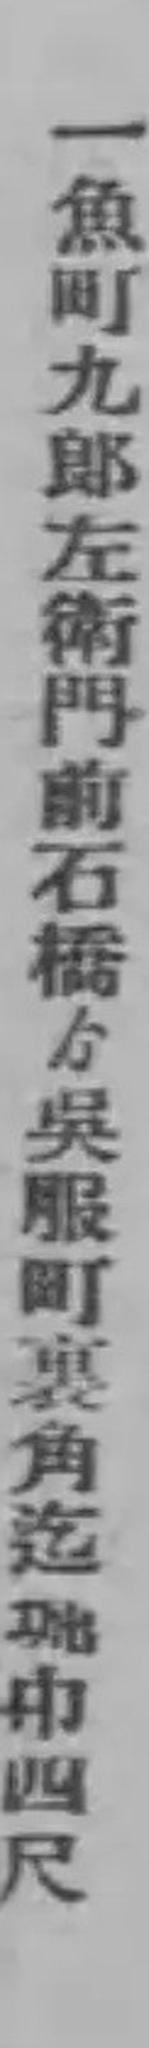一魚町九郎左衛門前石橋ゟ呉服町裏角迄堀巾四尺
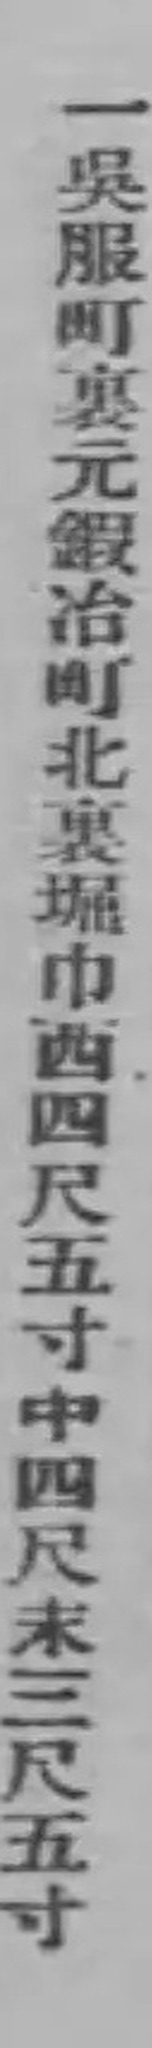一呉服町裏元鍛冶町北裏堀巾西四尺五寸中四尺末三尺五寸
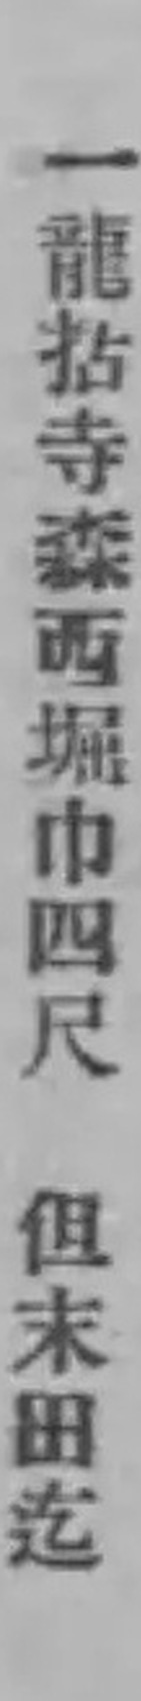一龍拈寺森西堀巾四尺但末田迄
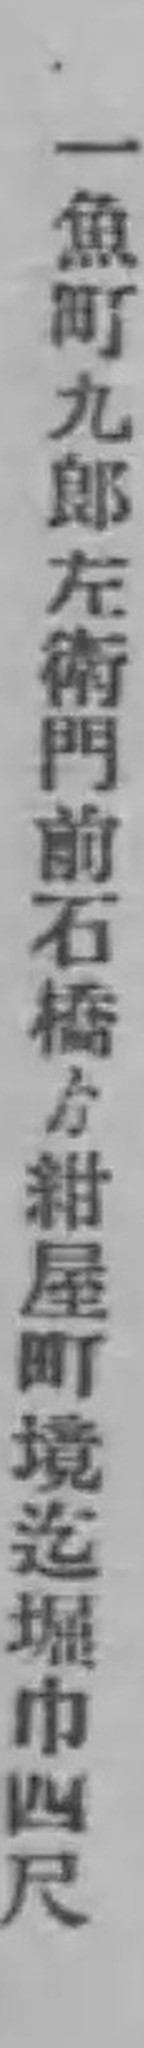一魚町九郎左衛門前石橋ゟ紺屋町境迄堀巾四尺
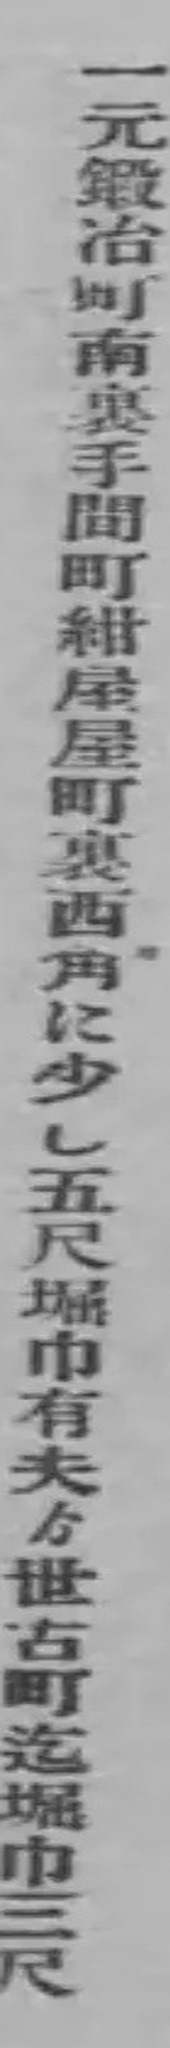一元鍛冶町南裏手間町紺屋町裏西角に少し五尺堀巾有夫ゟ世古町迄堀巾三尺
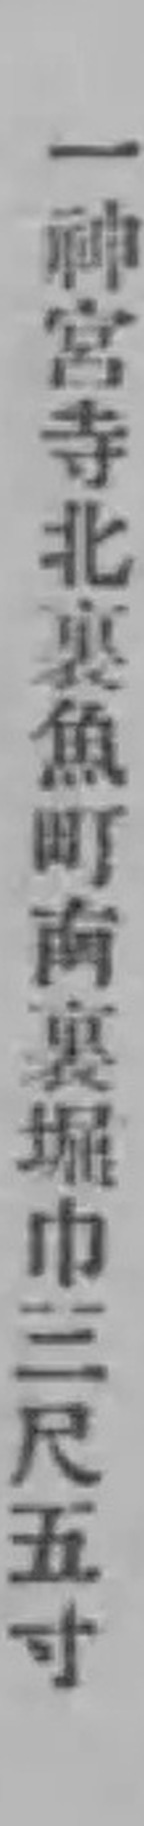一神宮寺北裏魚町南裏堀巾三尺五寸
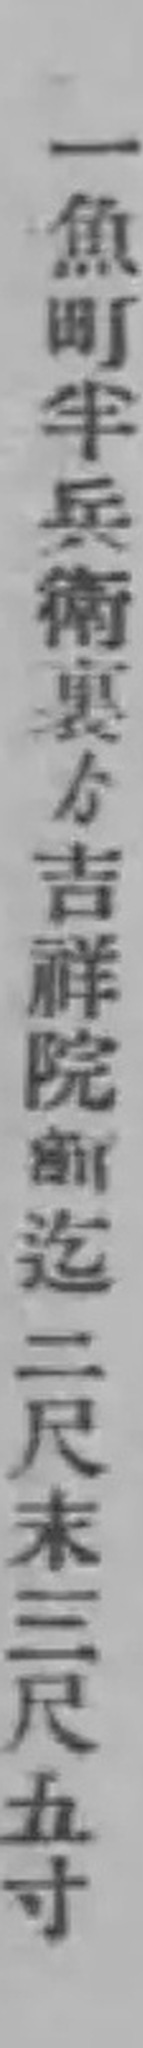一魚町半兵衛裏ゟ吉祥院前迄二尺末三尺五寸
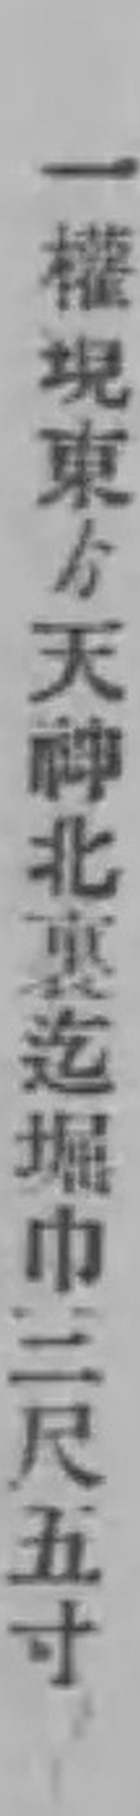一権現東ゟ天神北裏迄堀巾三尺五寸
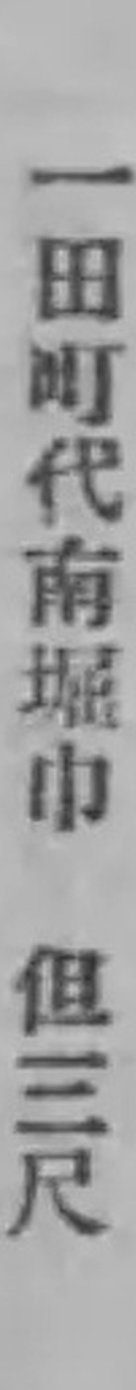一田町代南堀巾但三尺
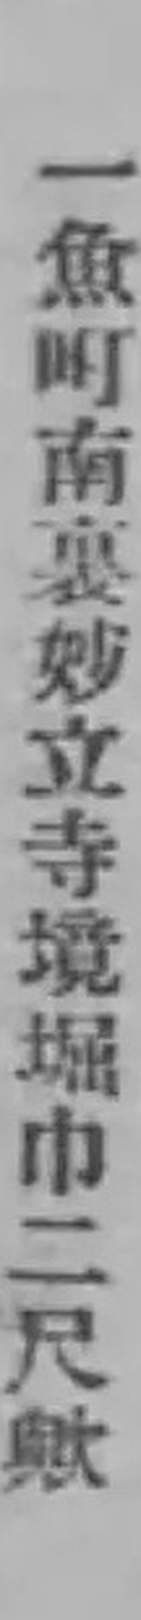一魚町南裏妙立寺境堀巾二尺歟
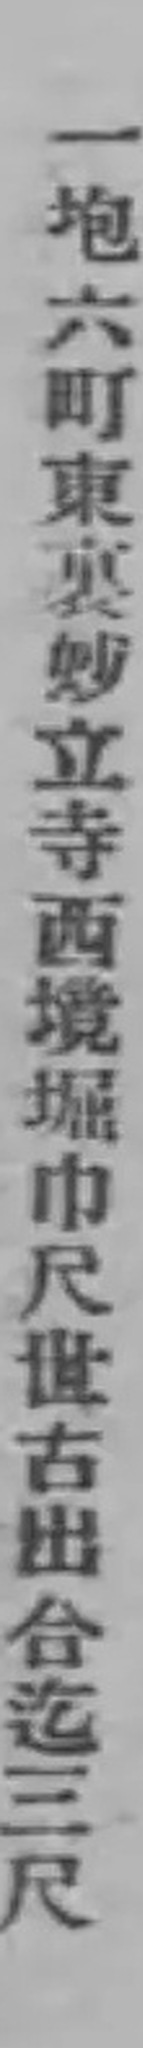一垉六町東裏妙立寺西境堀巾尺世古出合迄三尺
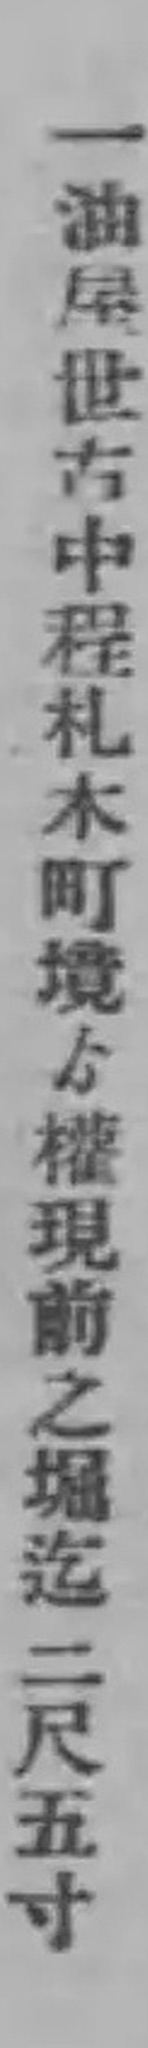一油屋世古中程札木町境ゟ権現前之堀迄二尺五寸
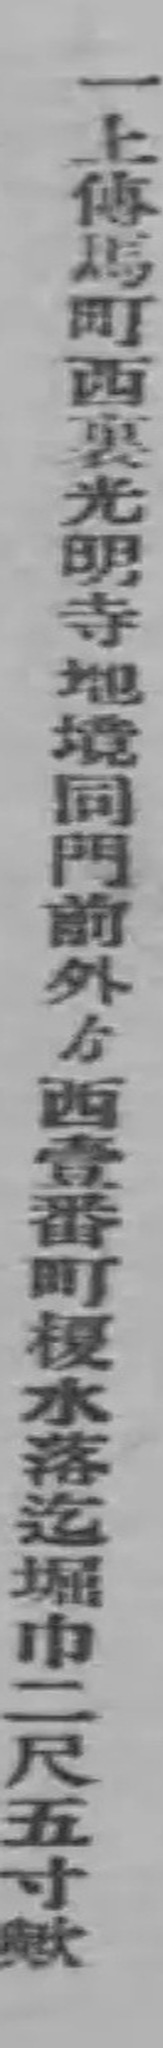一上伝馬町西裏光明寺地境同門前外ゟ西壱番町榎水落迄堀巾二尺五寸歟
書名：豊橋市史談
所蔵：国立国会図書館 National Diet Library, JAPAN
